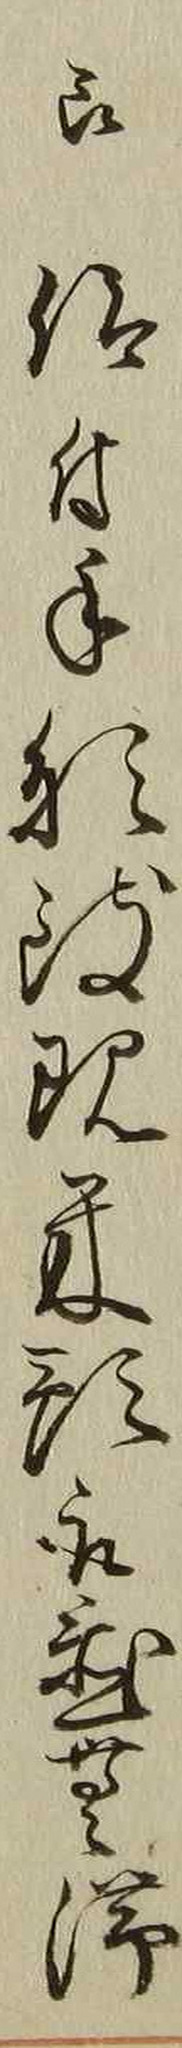被仰付手形致現米預取置無滞
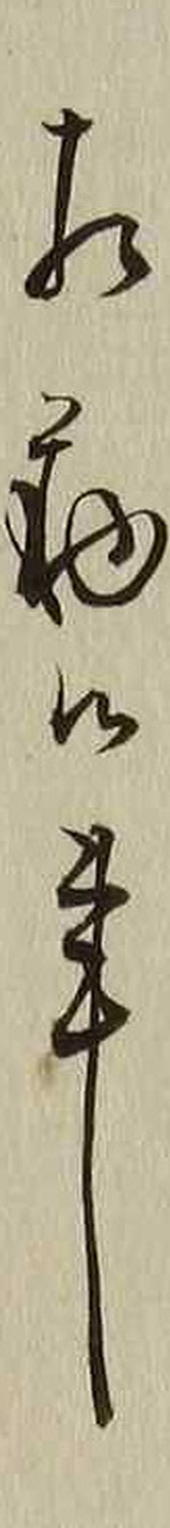相勤侯事
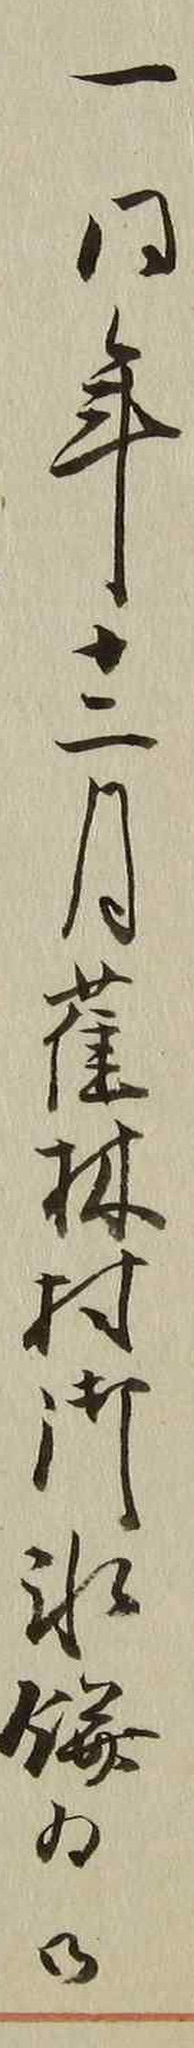一同年十二月雀林村御氷餅為御
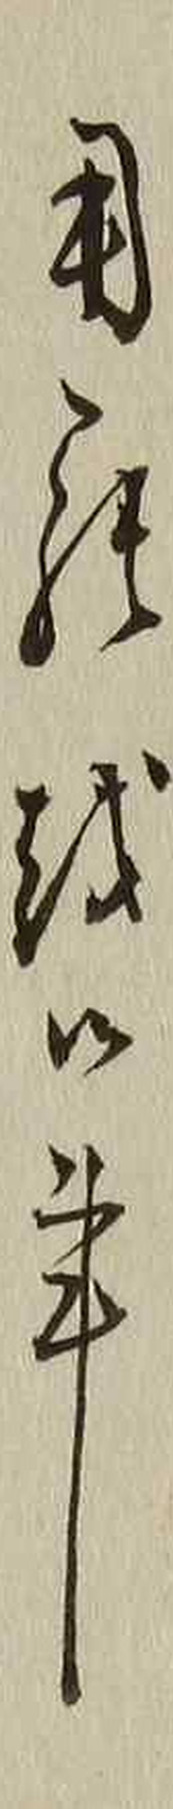用罷越候事
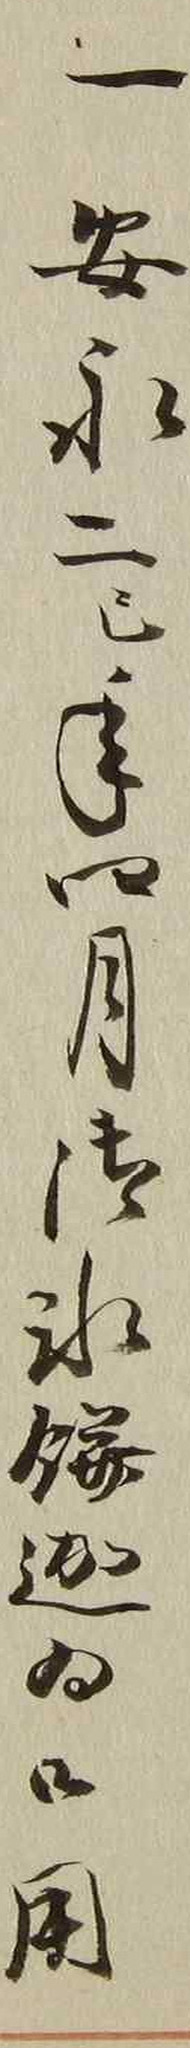一安永二巳年四月御氷餅迦為御用
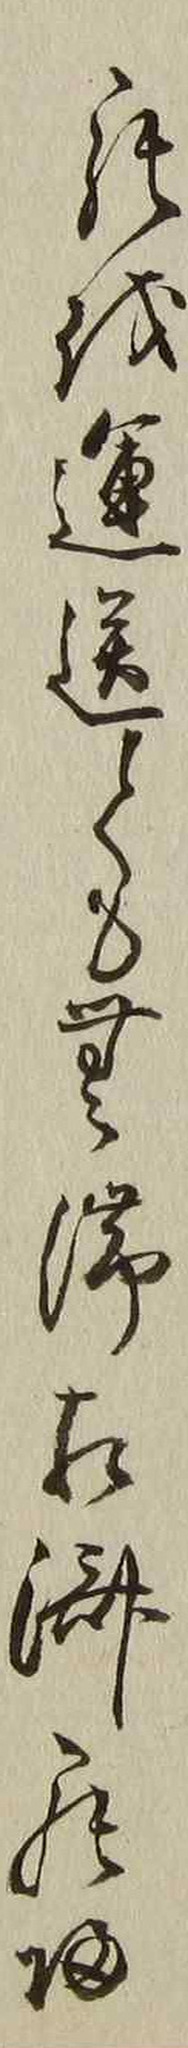罷越運送とも無滞相済罷帰
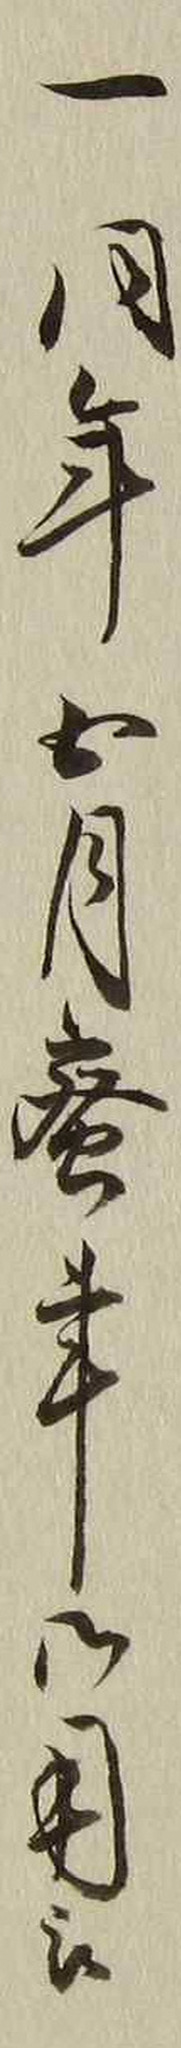一同年五月密事御用被
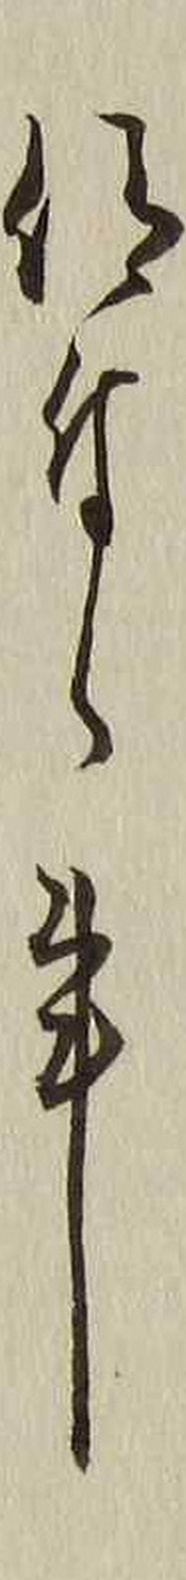仰付候事
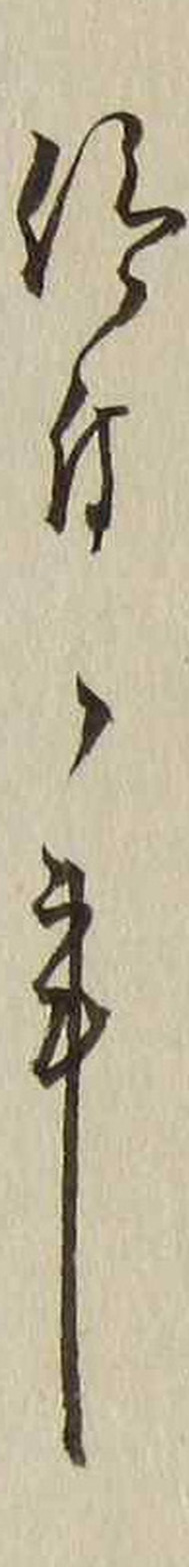仰付候事
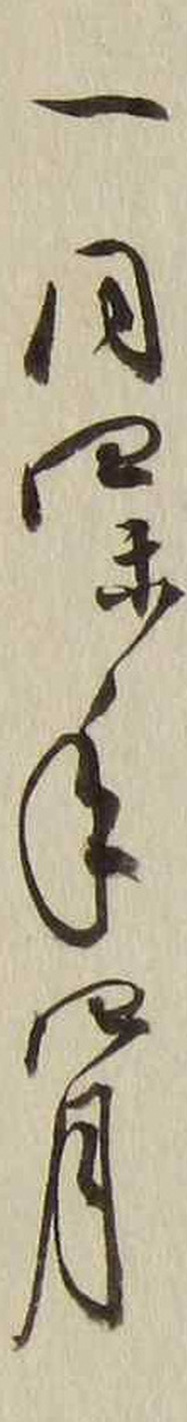一同四未年四月

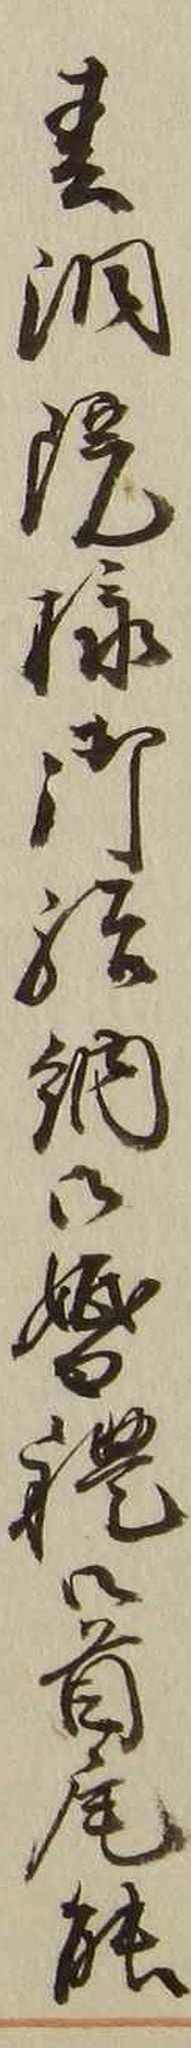春洞院様御結納御婚礼御首尾能
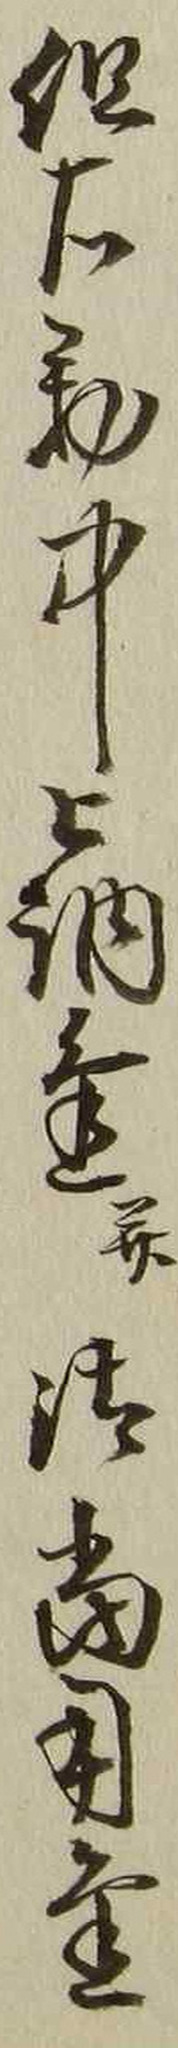但右勤中上納金并御当用金
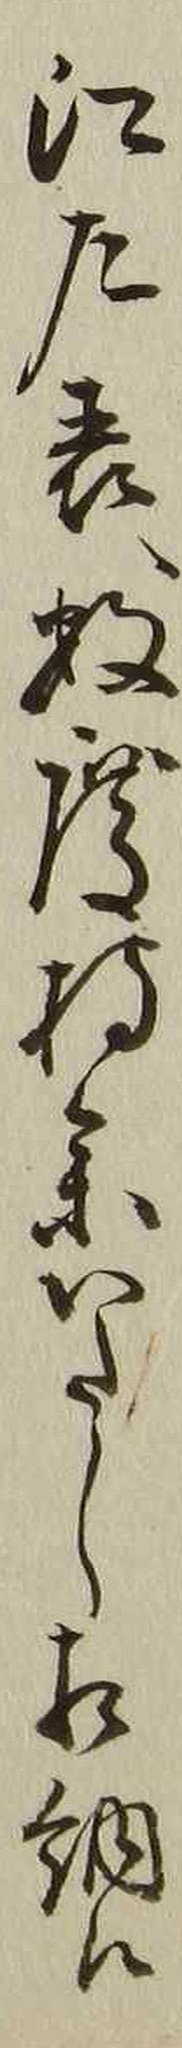江戸表へ数度持参いたし相納候
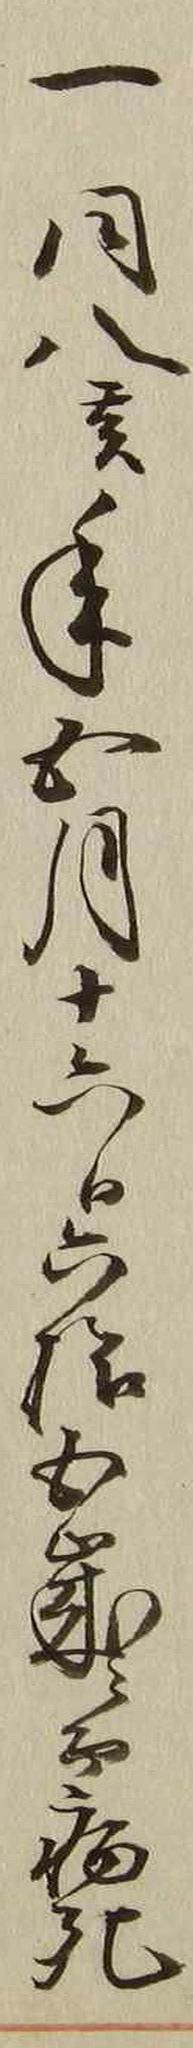一同八亥年五月十六日六拾五歳ニ而病死
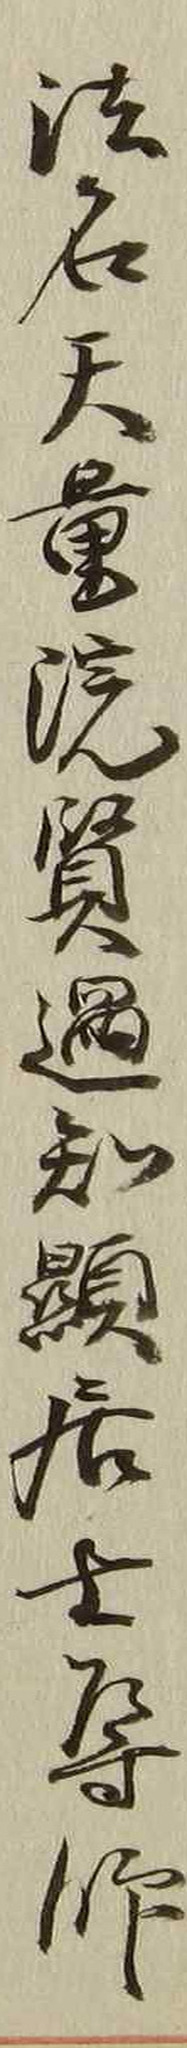法名天量院賢遇知顕居士導師
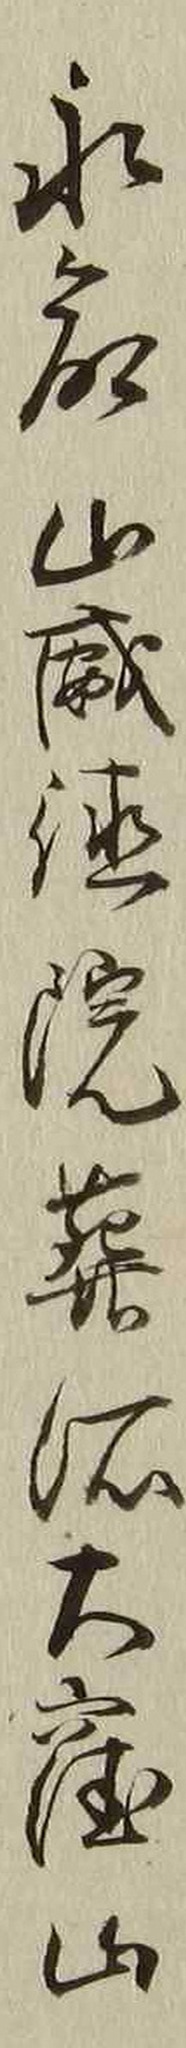永命山威徳院葬所大窪山
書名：諸士系譜　巻之57　ほ之部4
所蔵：会津若松市立会津図書館
